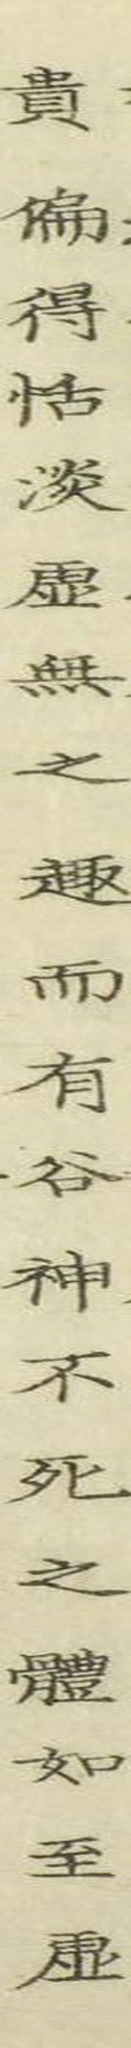貴偏得恬淡虚無之趣而有谷神不死之體如至虚
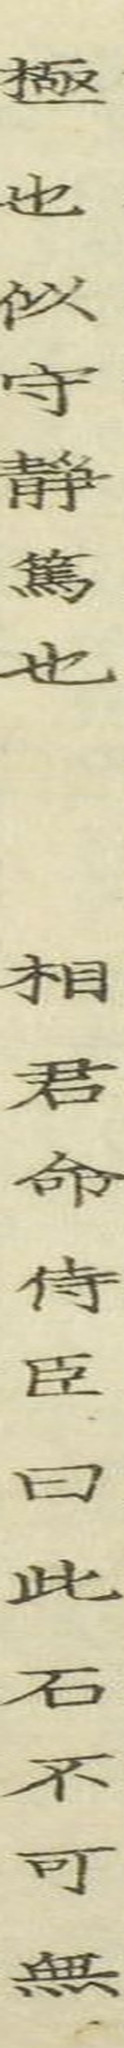極也似守靜篤也相君命侍臣曰此石不可無
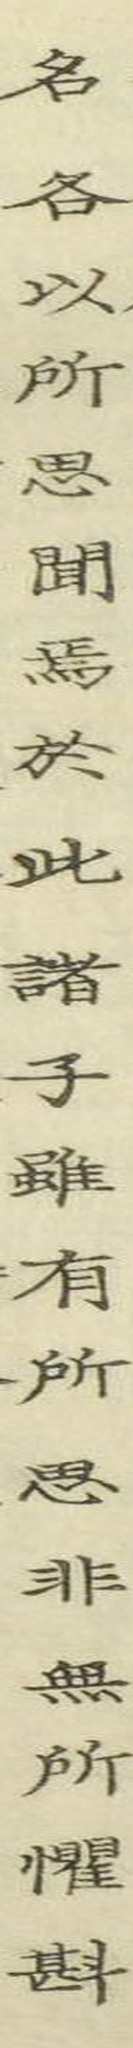名各以所思聞焉於此諸子雖有所思非無所懼斟
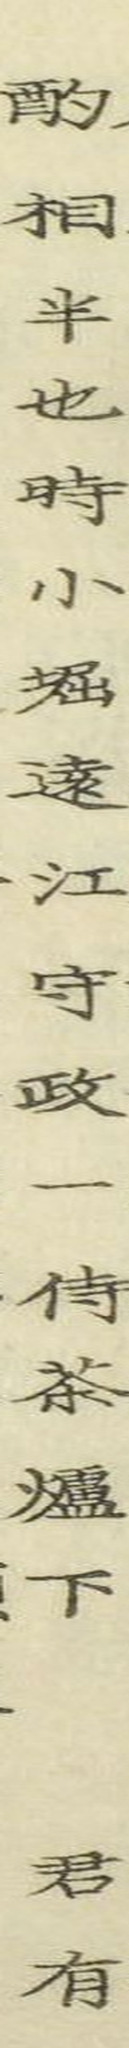酌相半也時小堀遠江守政一侍茶爐下君有
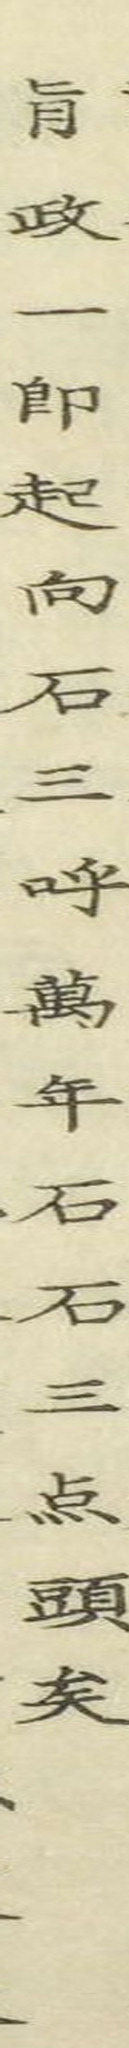旨政一卽起向石三呼萬年石石三点頭矣
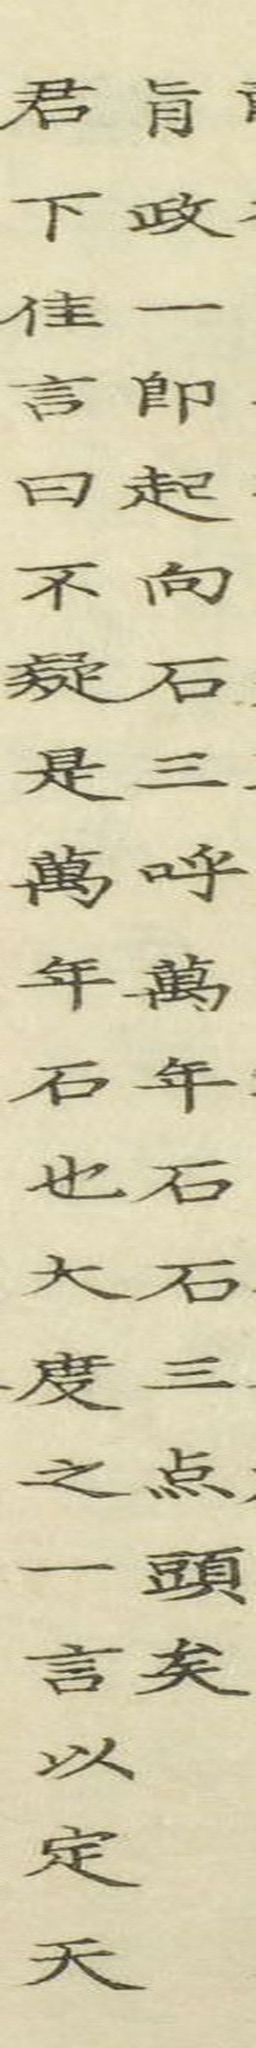君下佳言曰不疑是萬年石也大度之一言以定天
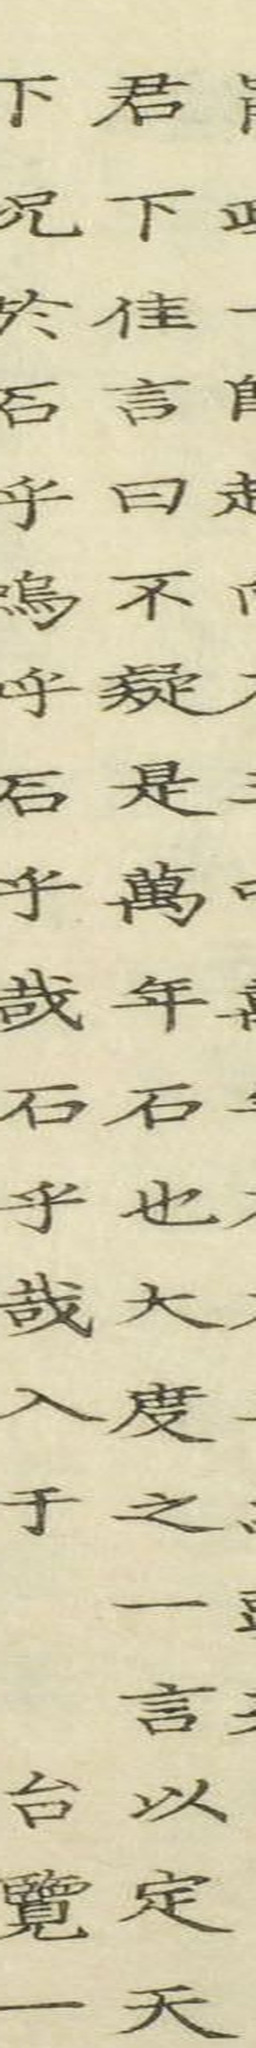下况於䂖乎嗚呼䂖乎哉石乎哉入于台覽一
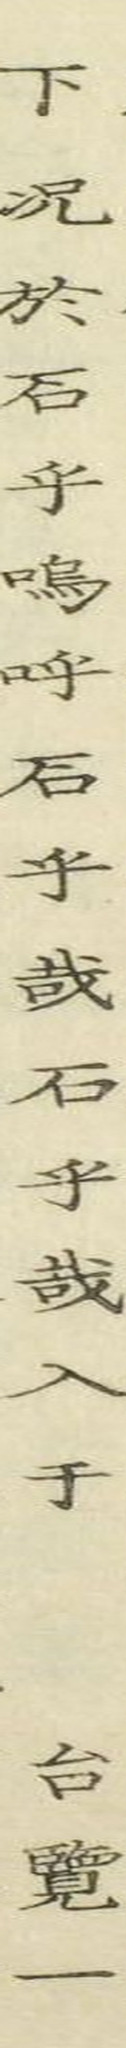下况於䂖乎嗚呼䂖乎哉石乎哉入于台覽一
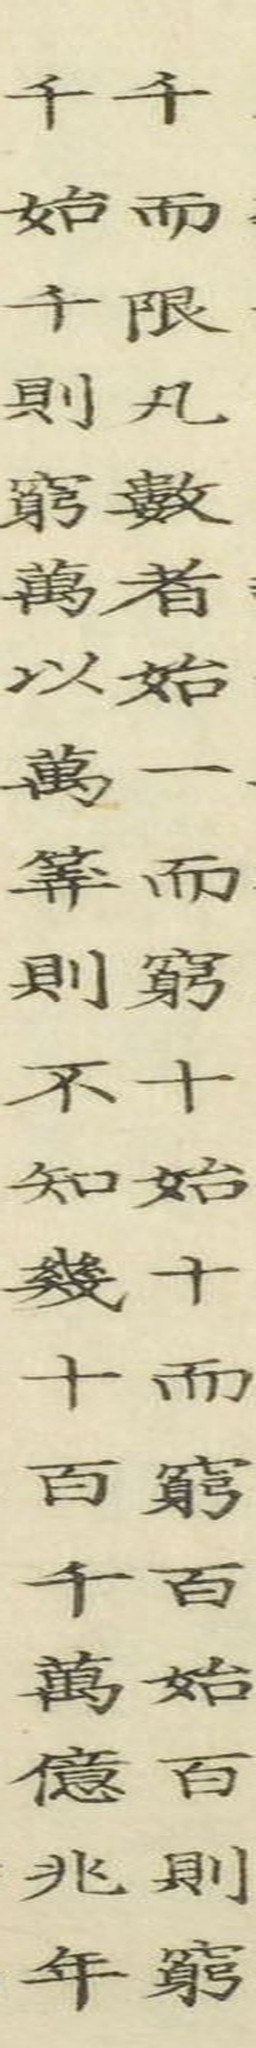千始千則窮萬以萬筭則不知幾十百千萬億兆年
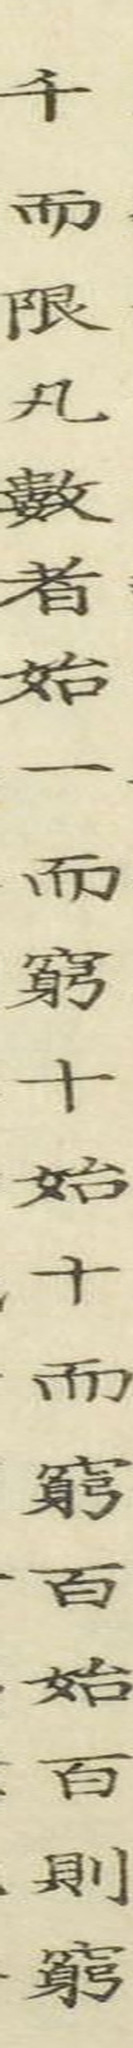千而限凡數者始一而窮十始十而窮百始百則窮
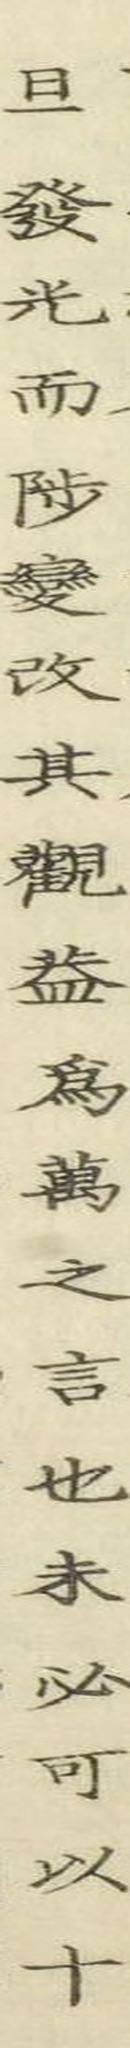旦發光而陟變改其觀葢爲萬之言也未必可以十
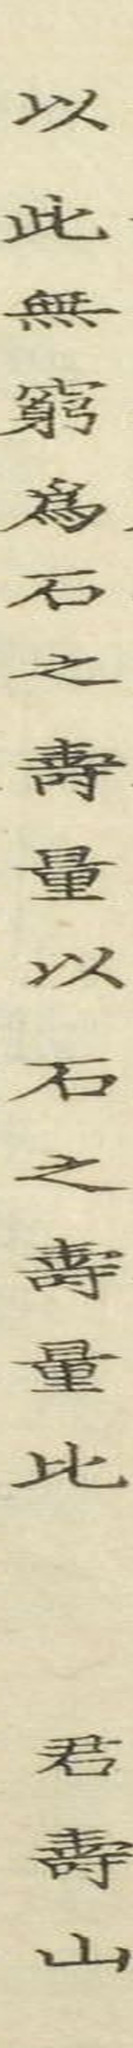以此無窮爲石之壽量以石之壽量比君壽山
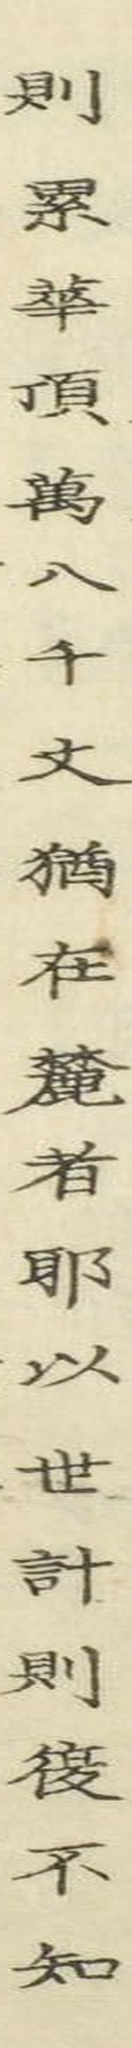則累蕐頂萬八千丈猶在麓者耶以世計則復不知
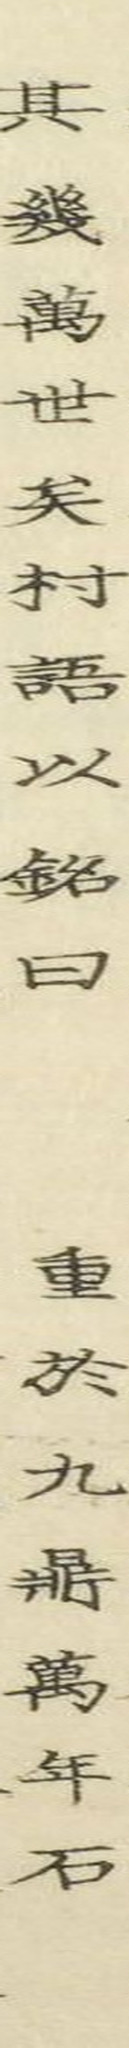其幾萬世矣村語以銘曰重於九鼎萬年石
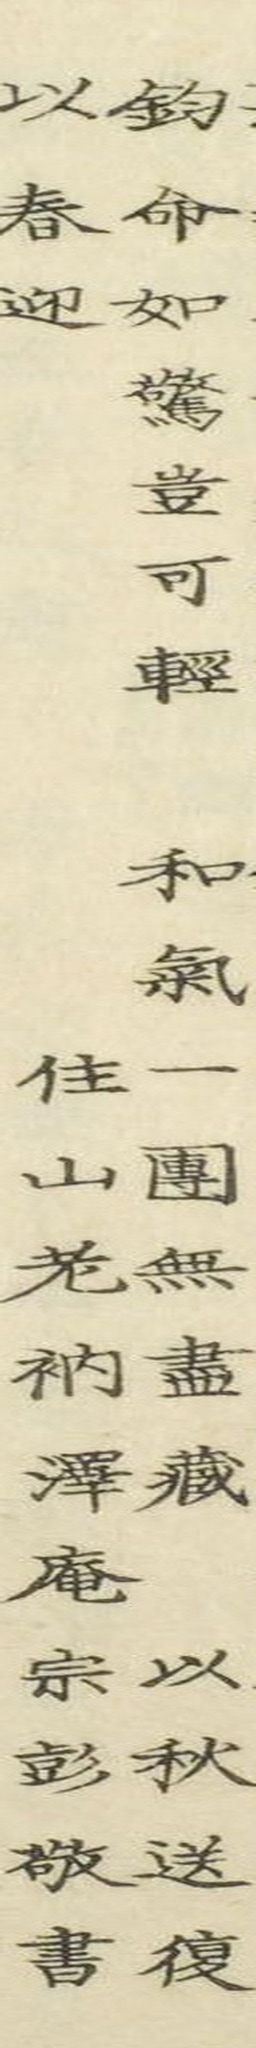以春迎住山老衲澤庵宗彭敬書
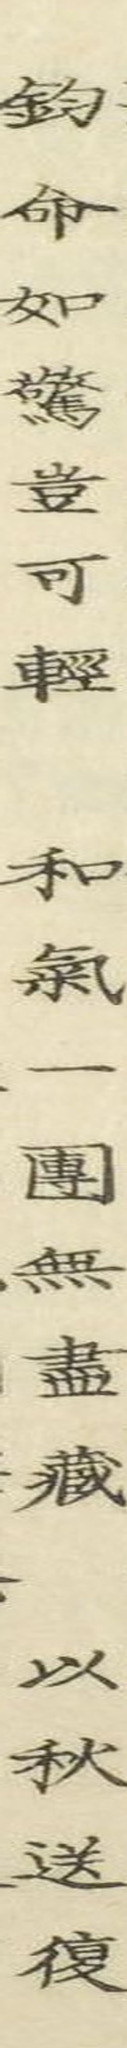鈞命如驚豈可輕和氣一團無盡藏以秋送復
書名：江戸名所図会 20巻 巻之4
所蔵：東京学芸大学教育コンテンツアーカイブ
